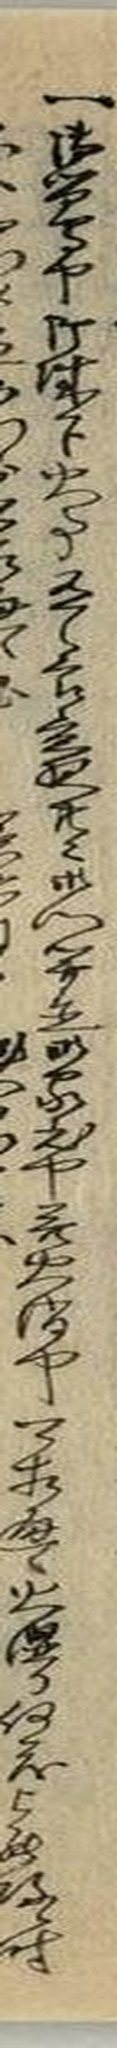一御留守中御城下火事有之節昼夜共に御門開置御家老中并火消中可相通候火湿り何も被罷帰候時
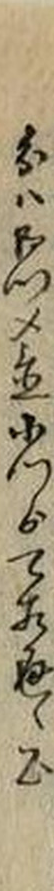分は御門〆置小門ゟ可相通候以上
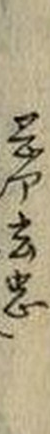岡部玄忠
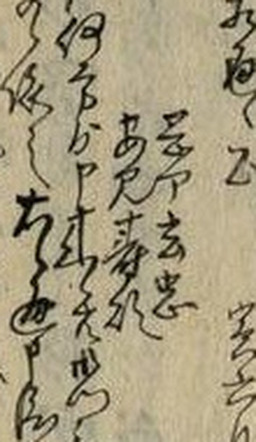安見寿碩
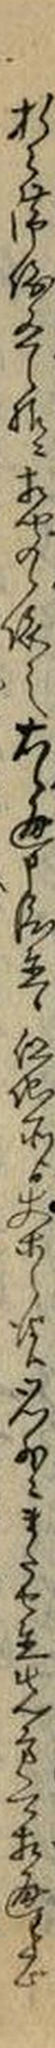折々滞儀有之候様に相聞候依之左之通申渡置候但他所ゟ使等之儀は御門外にまたせ置先方へ可相通候以上
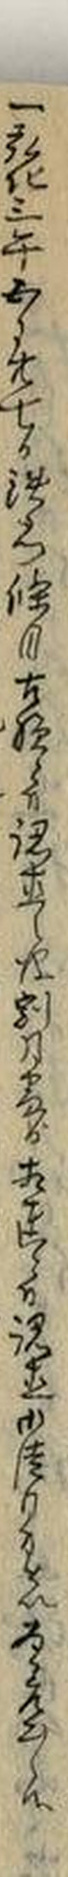一弘化三午五月廿七日鉄御門条目古損に付認直候儀割月番ゟ相達候に付認直御徒目付を以為差出之候
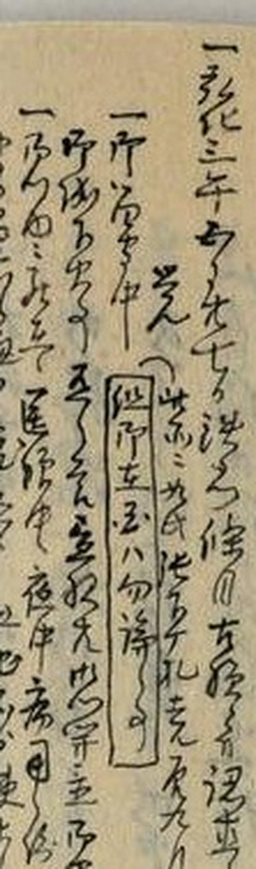一御留守中但御在国は勿論之事
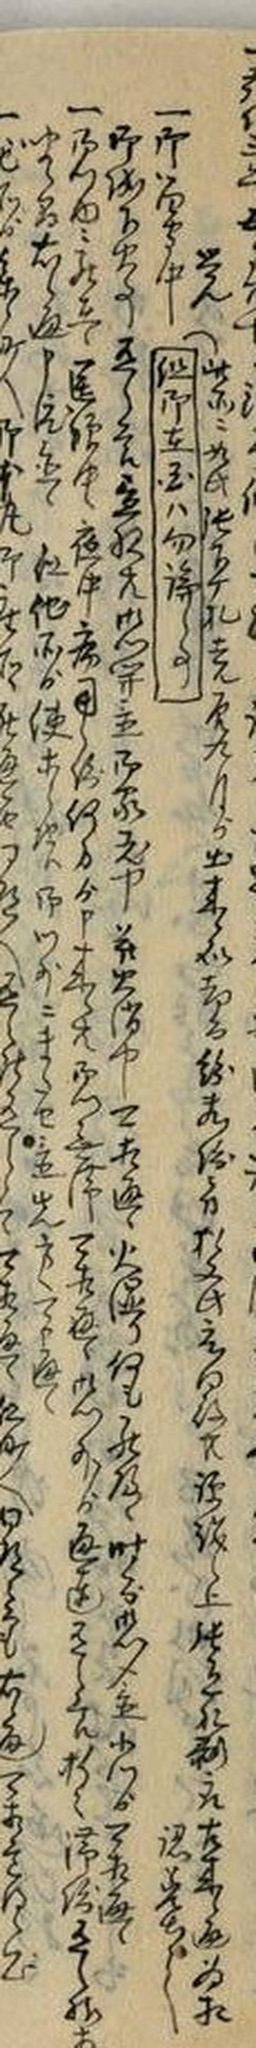御城下火事有之節昼夜共御門開置御家老中并火消中可相通候火湿り何も罷帰候時分御門〆置小門ゟ可相通候
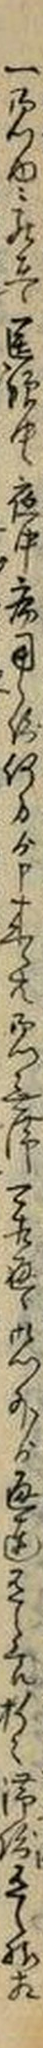一御門内に罷在候医師中へ夜中病用の儀何方ゟ申来候共御門無滞可相通候御門外ゟ通達有之節折々滞候儀有之候様相
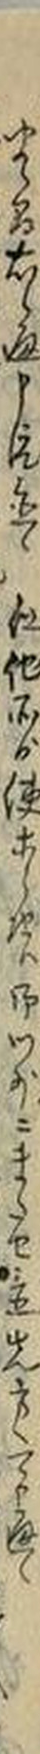聞候間右之通申渡置候但他国ゟ使等之儀は御門外にまたせ置先方へ可申通候
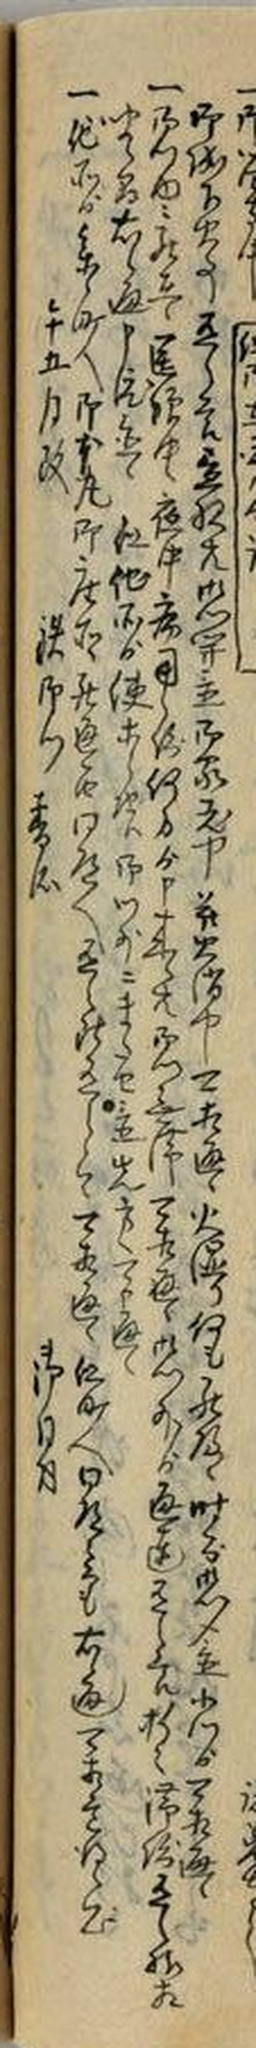聞候間右之通申渡置候但他国ゟ使等之儀は御門外にまたせ置先方へ可申通候
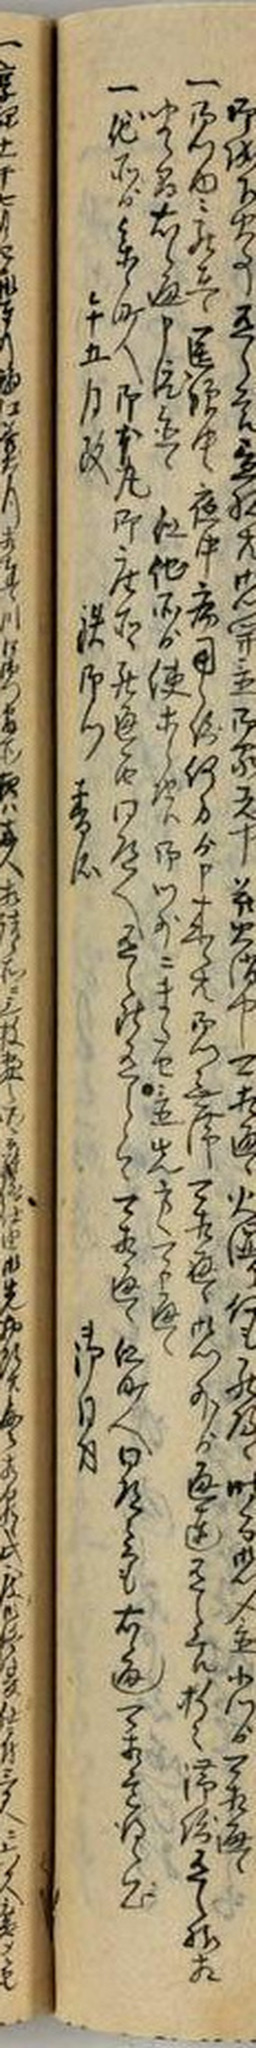一他所ゟ参候町人御本丸御座所へ罷通候儀同道人有之断有之候はゝ可相通候但町人同道に而も右之通可相意得候以上
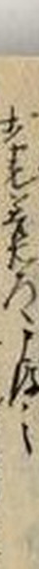於宅善左衛門へ申渡之
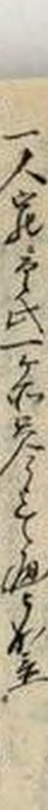一人宛に而此一ヶ所只今迄之通被成置

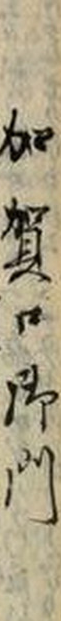加賀口御門
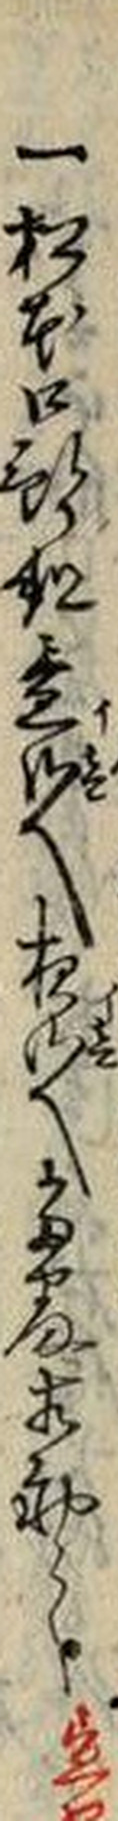一松本口預り組昼弐人夜弐人当番相勤候事
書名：御門御櫓之部
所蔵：福井県文書館 Fukui Prefectural Archives
